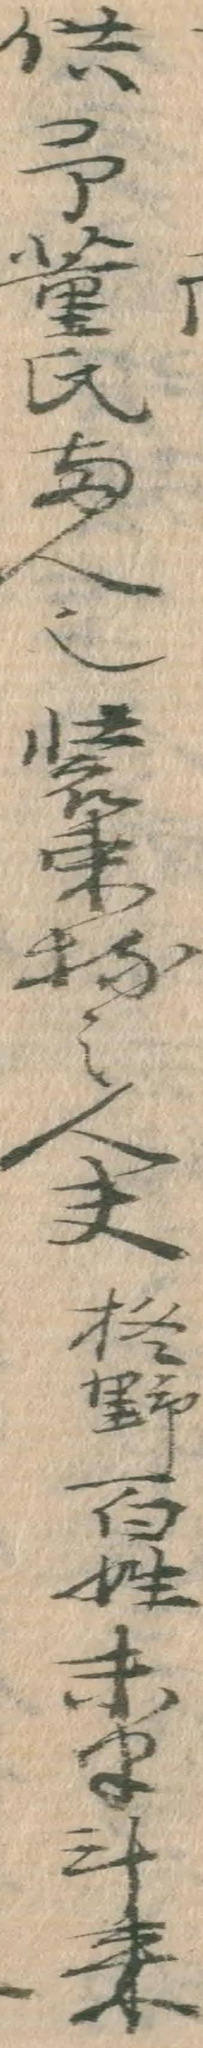供予董氏両人也装束持之人夫柊野百姓未半斗来
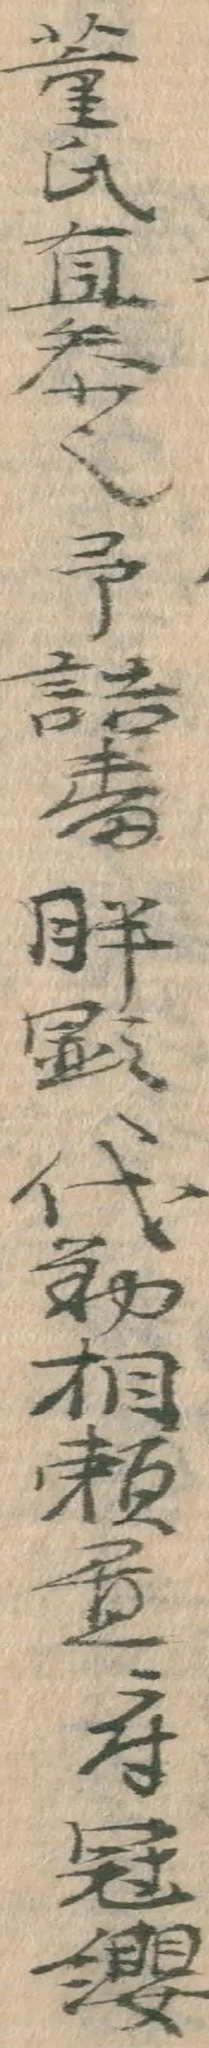董氏直参也予詰番胖顕へ代勤相頼置ニ付冠纓
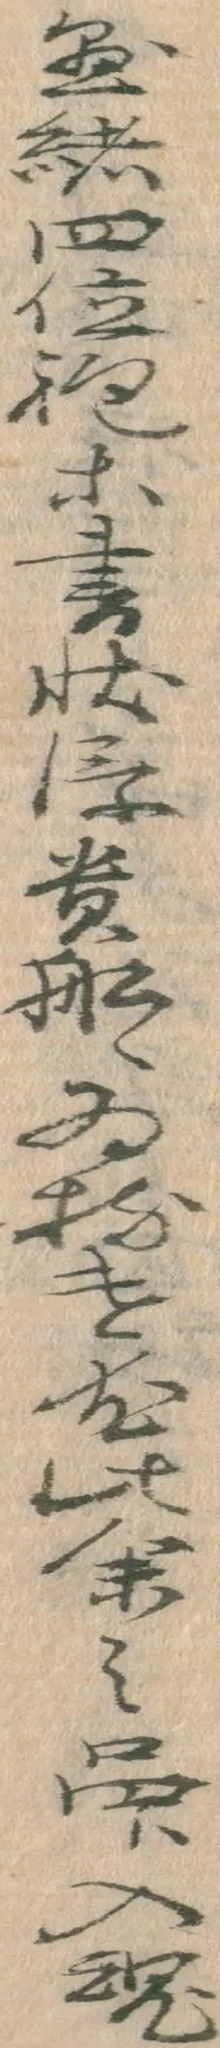懸諸四位袍等書状添貴舩へ為持遣尤此余之品ハ入魂
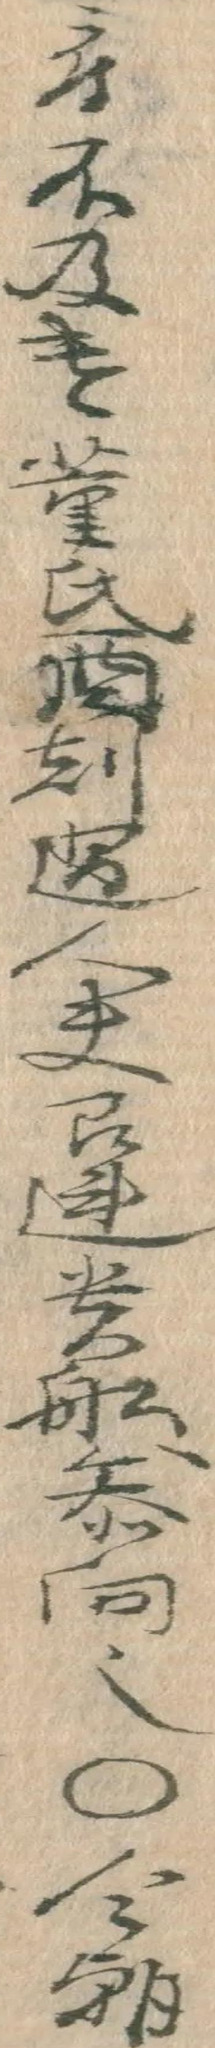ニ付不及遣董氏酉刻過人夫召連貴舩へ参向也○今朝
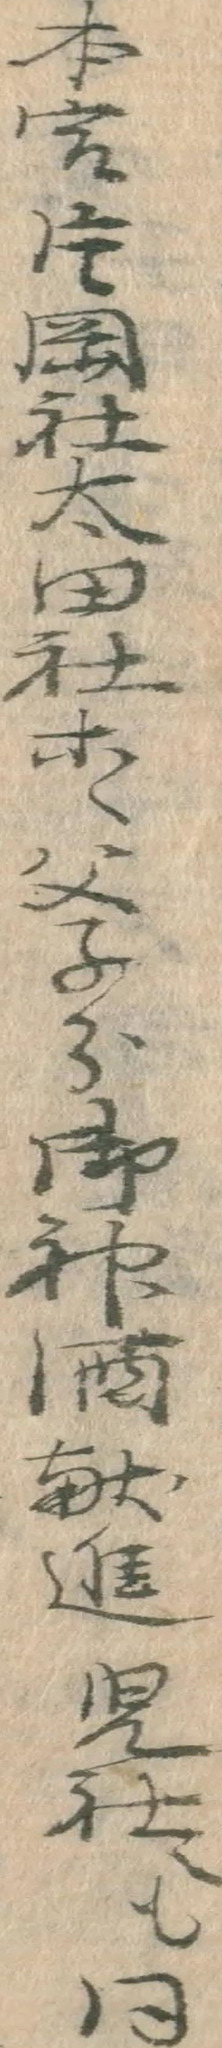本宮片岡社太田社等へ父子分御神酒献進児社へも同
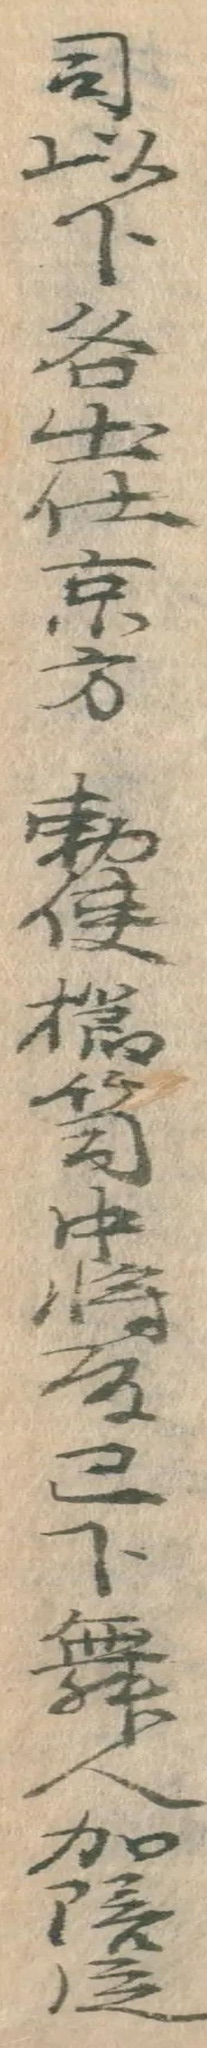司以下各出仕京方勅使櫛笥中将殿已下舞人加陪臣
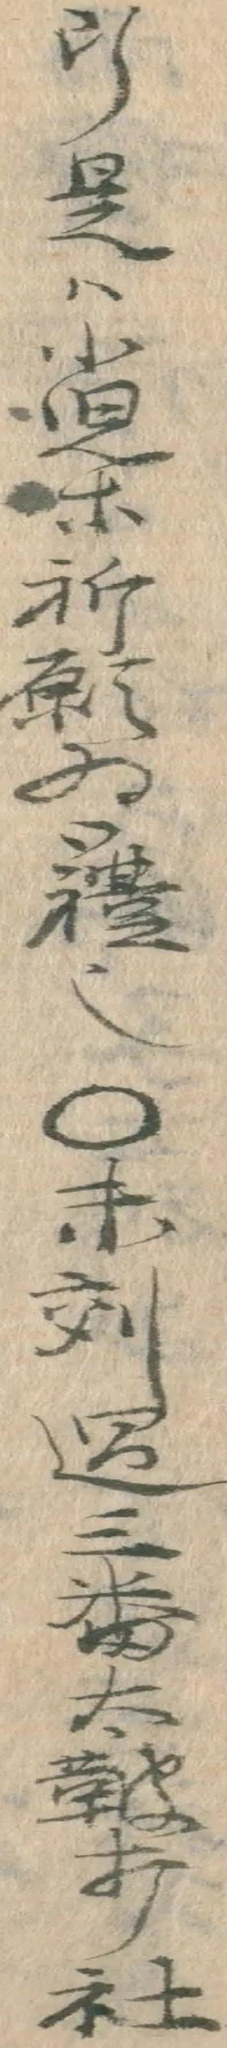断是ハ小児等祈願為御禮也○未刻過三番太鼓打社

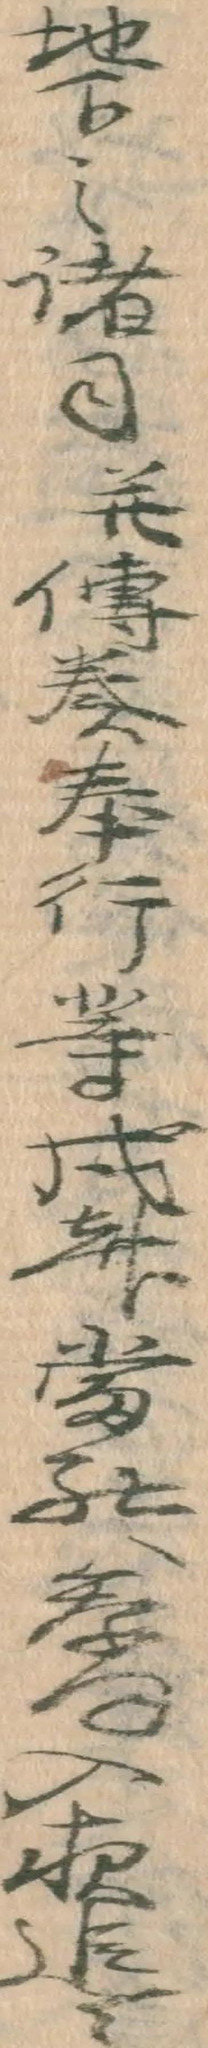地下之諸司幷傳奏奉行等戌刻當社へ参向入夜追々
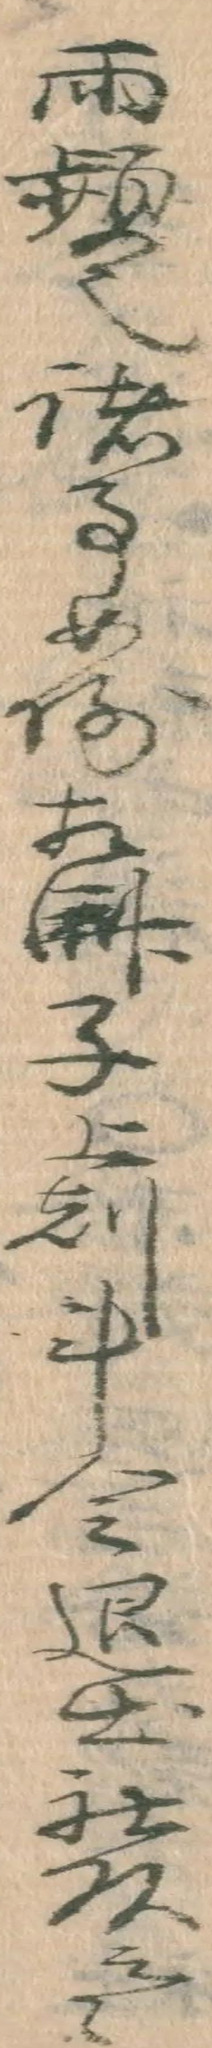雨頻也諸事如例相済子上刻斗令退出社頭云々
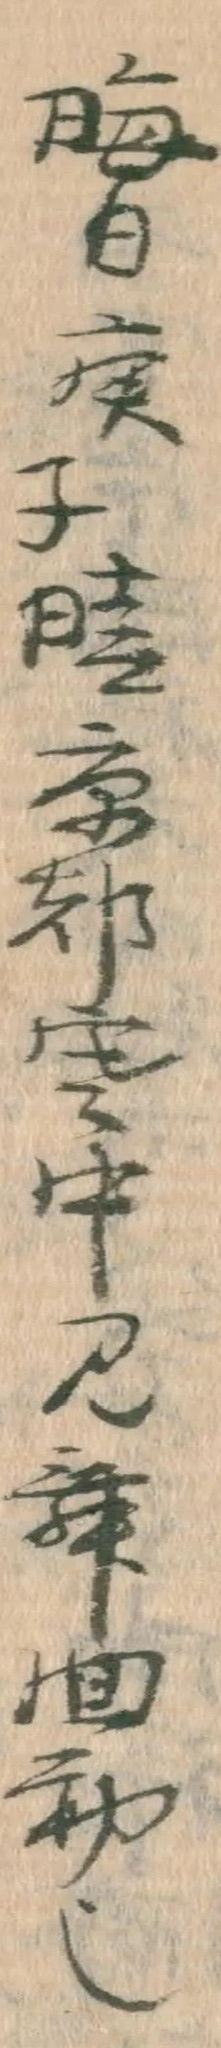晦日庚子晴京都寒中見舞回勤也
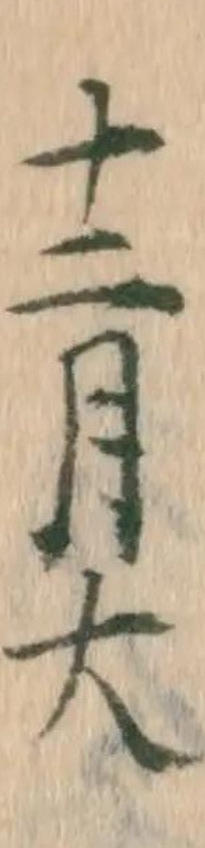十二月大
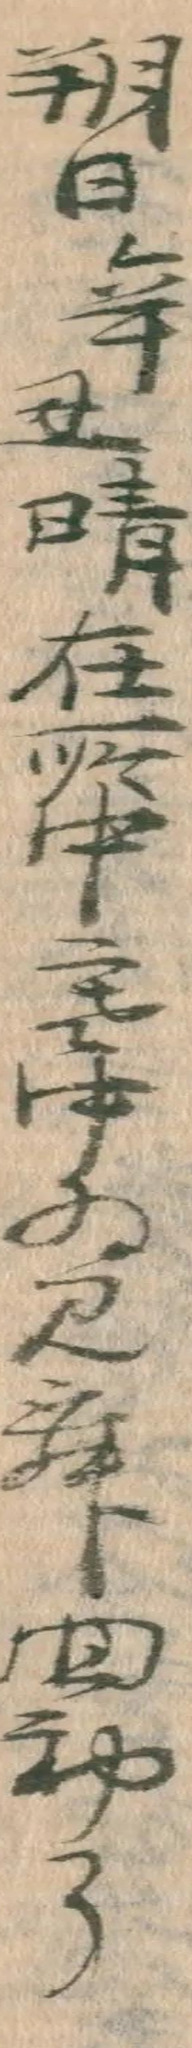朔日辛丑晴在所中寒中為見舞ト回初了
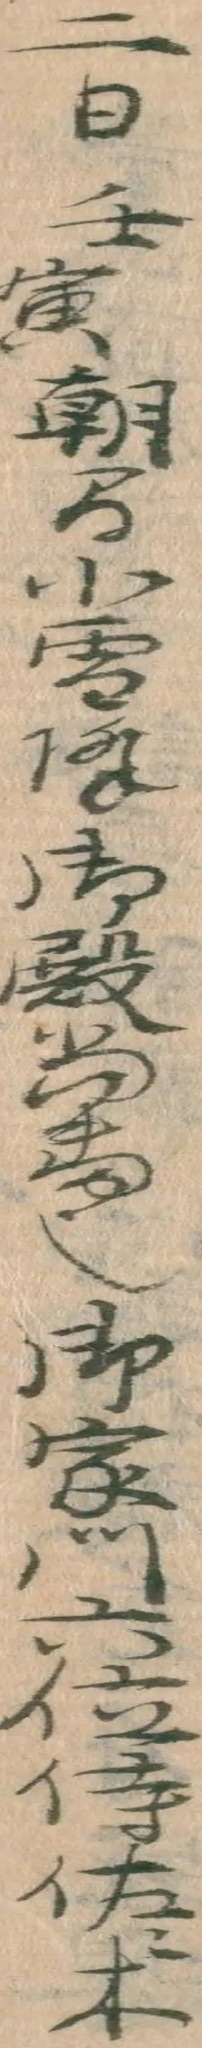二日壬寅朝間小雪降御殿當番也御家門六位侍佐々木
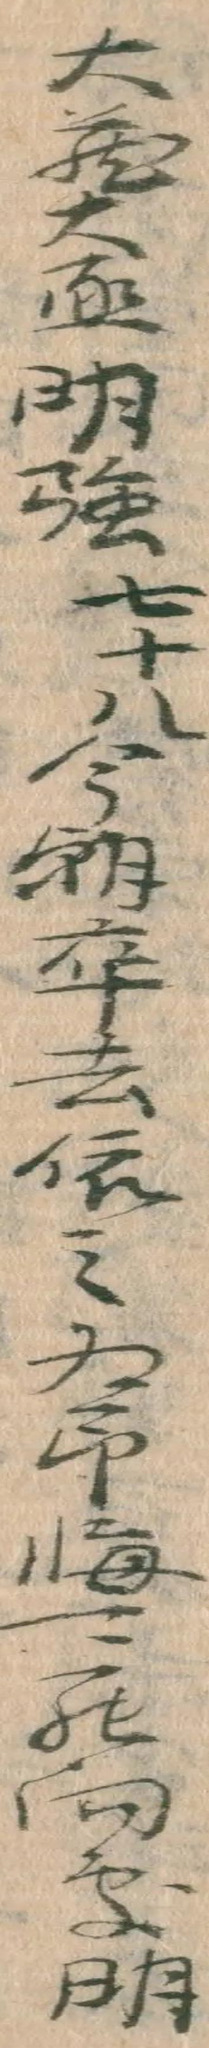大蔵大丞明強七十八今朝卒去依之為即悔可罷向處明
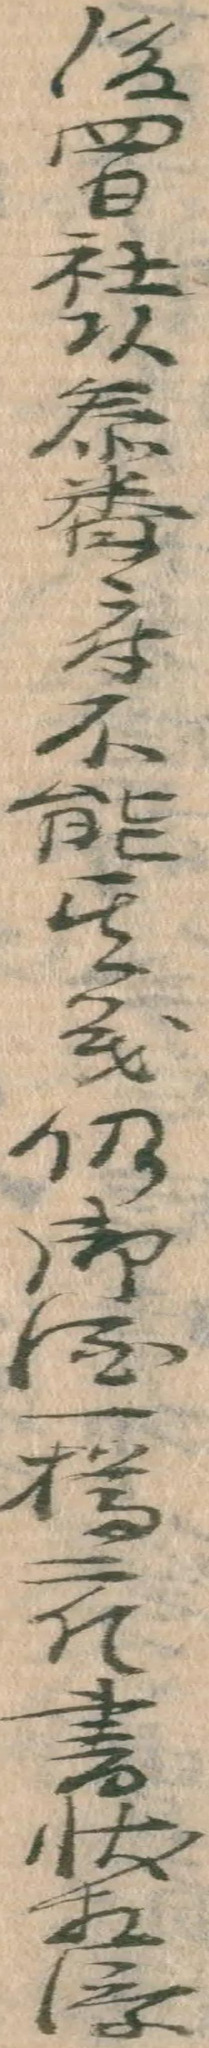後四日社頭参番ニ付不能其義仍御酒一樽二升書状相添
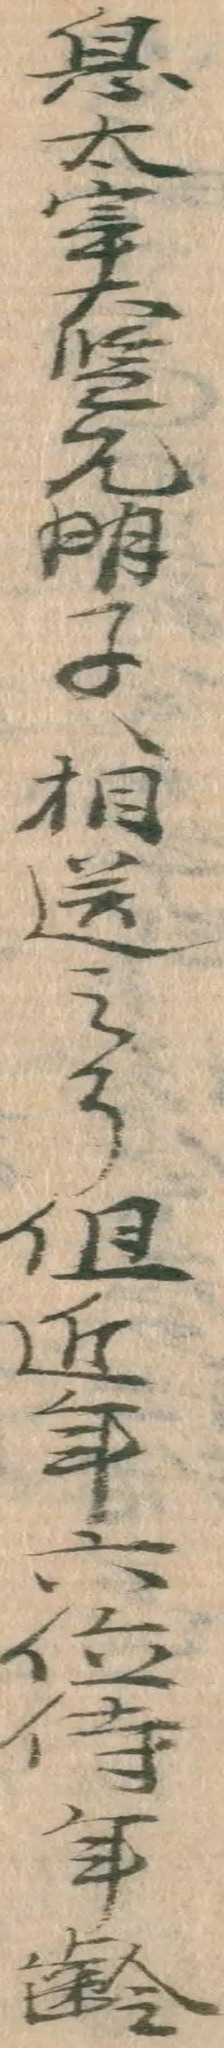息太宰大監元明子へ相送之了但近年六位侍年齢
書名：賀茂社記録. 第63冊
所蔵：国立国会図書館 National Diet Library, JAPAN
